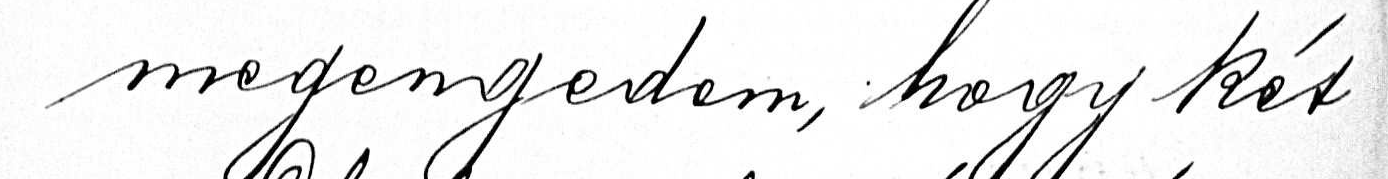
megengedem, hogy két
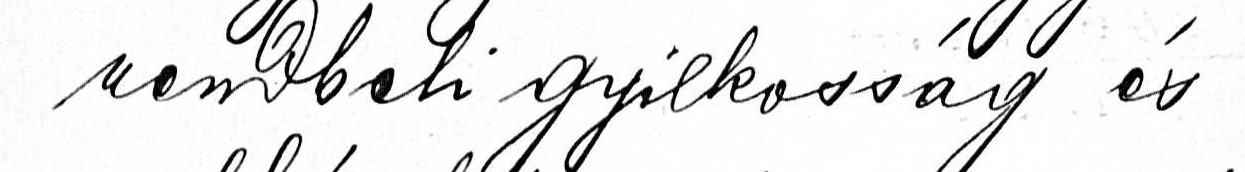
uendbch gyilkosság és
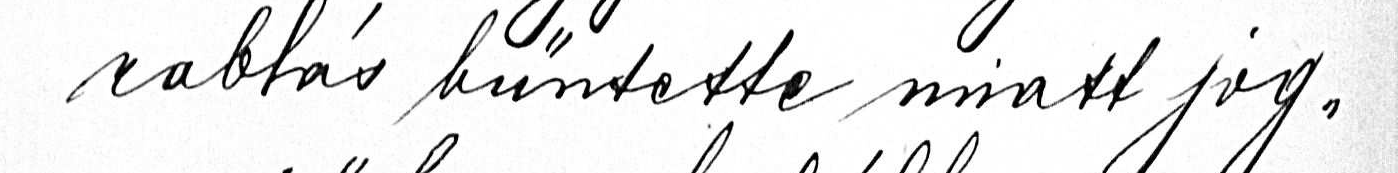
rabtás büntette miatt jog¬
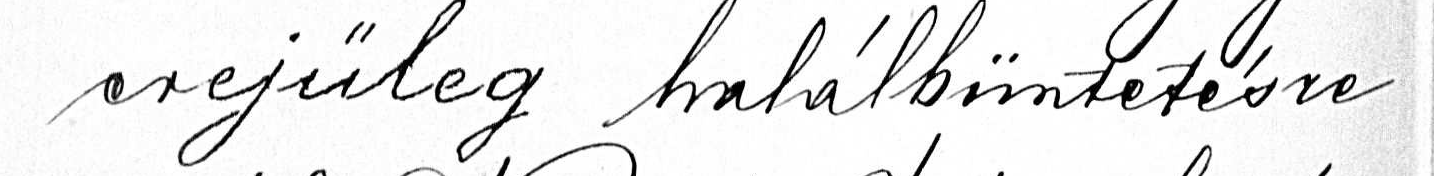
exejüleg halálbüntetésre
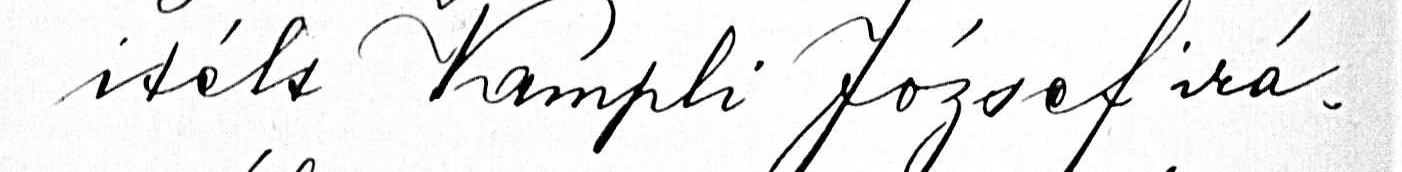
itélt Vampli József dá¬
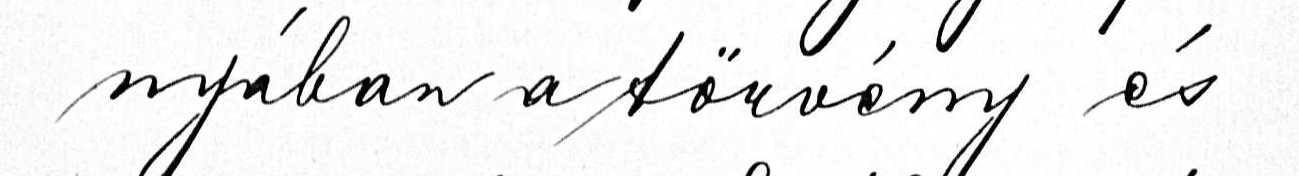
nyában a tönvény és
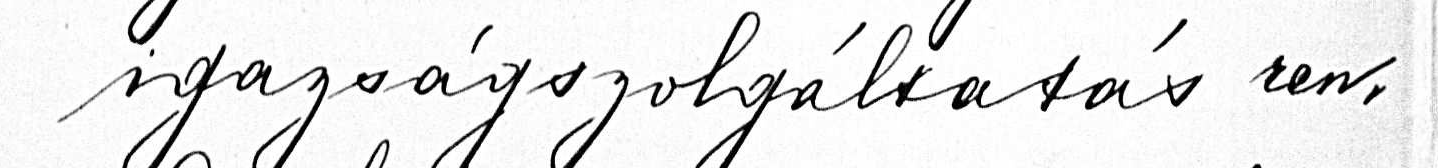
igazségszolgélratés ren¬
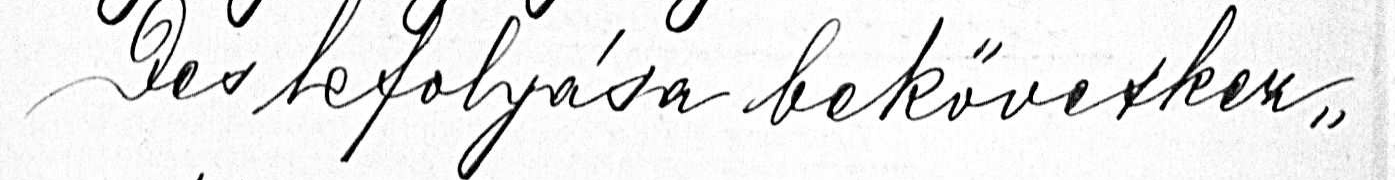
Deslefolyésa bekövetker¬
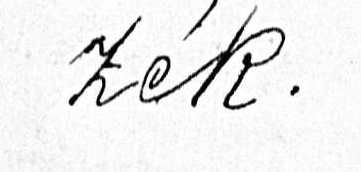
zék.
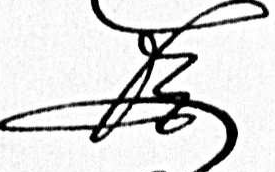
FJ
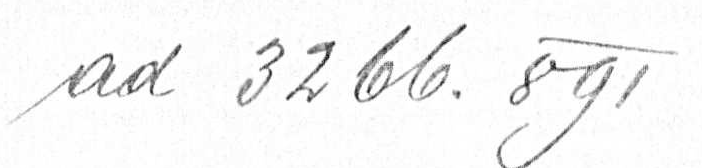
ad 3266 1891
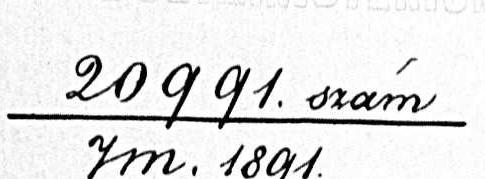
20991 szám/
